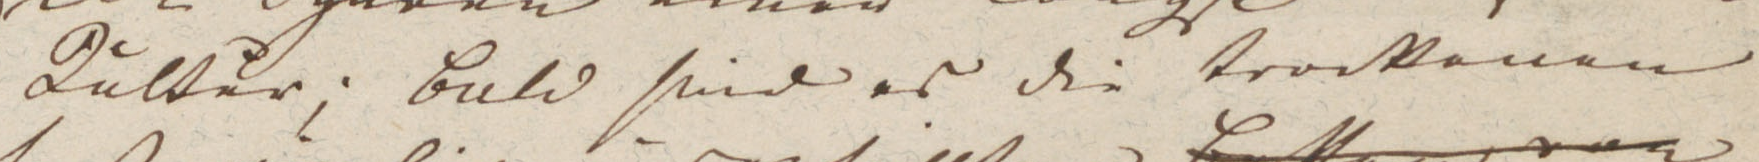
Kultur; Bald sind es die trockenen
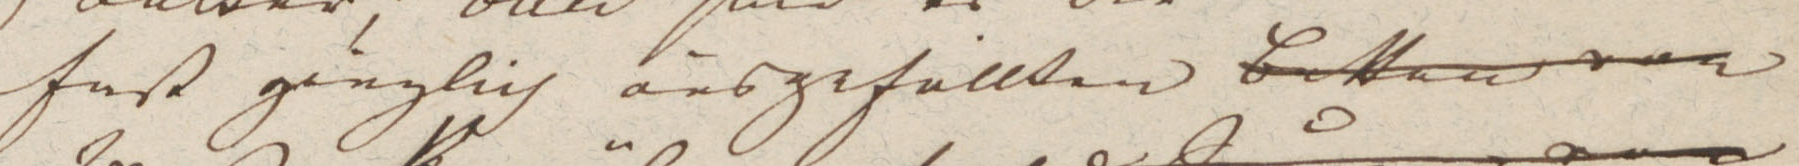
fast gänzlich ausgefüllten Betten von
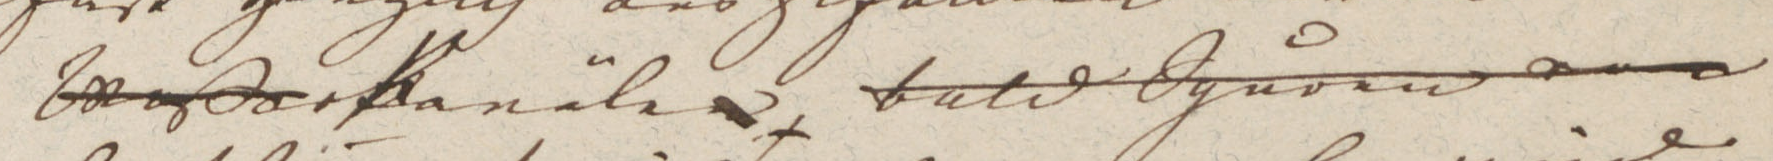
WasserkKanälen, bald Spuren von
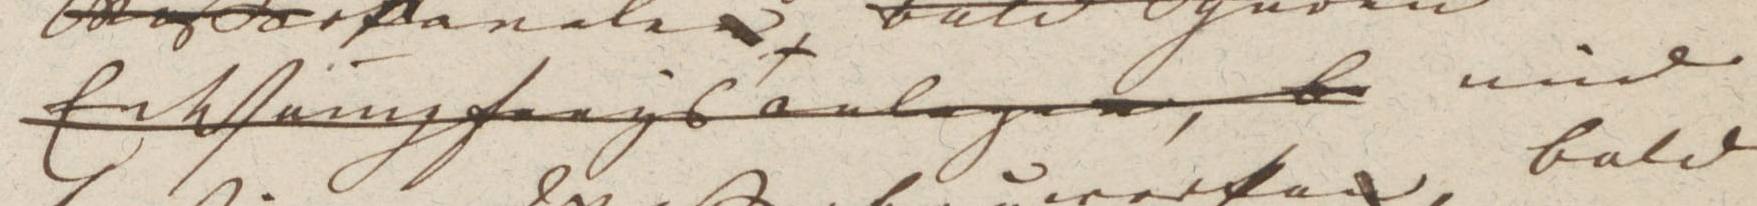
Entsumpfungsanlagen, b und
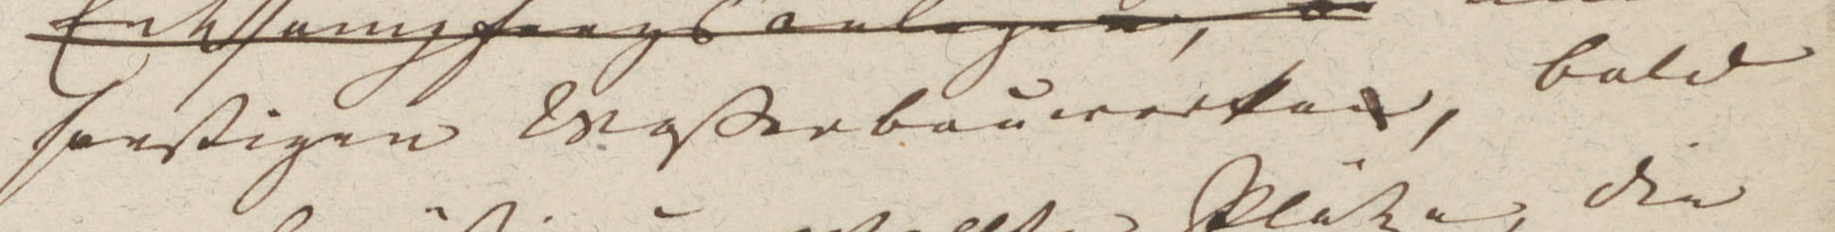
sonstigen Wasserbauwerken, bald
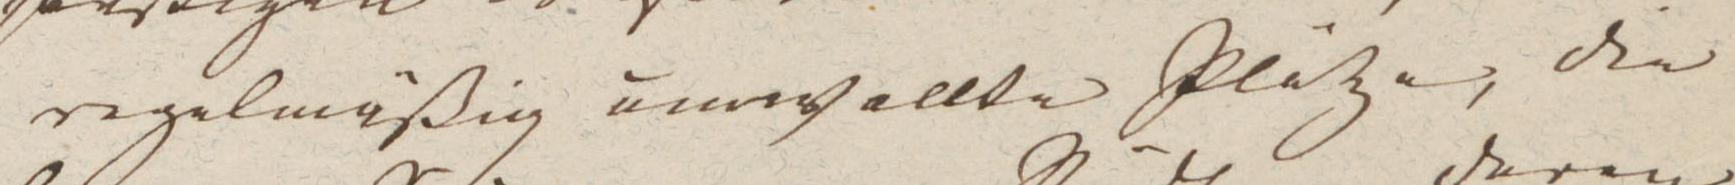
regelmässig umwallte Plätze, die
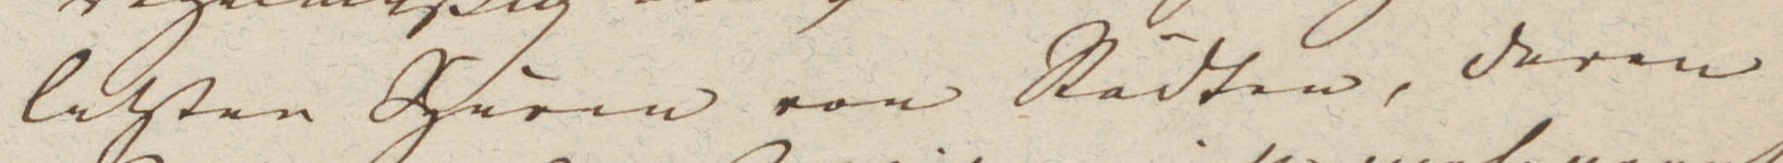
letzten Spuren von Städten, deren
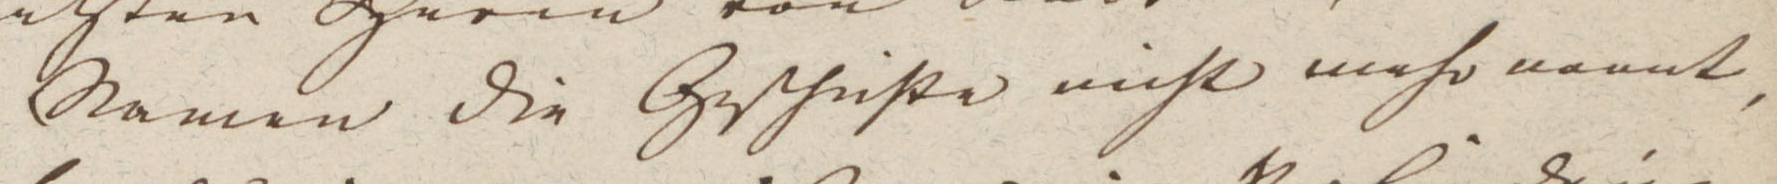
Namen die Geschichte nicht mehr nennt,
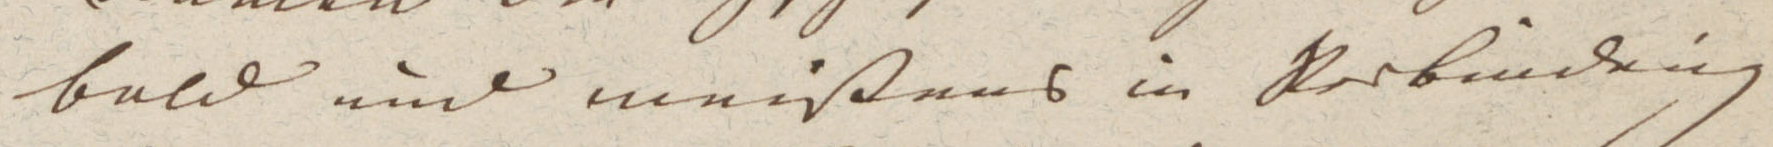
bald und meistens in Verbindung
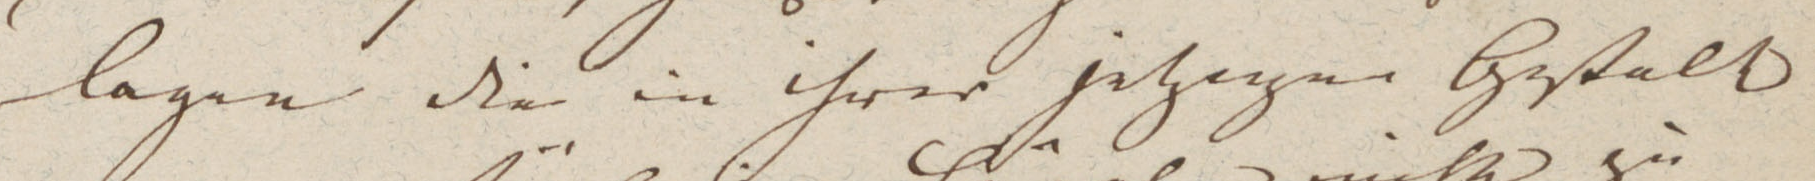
lagen die in ihrer jetzigen Gestalt
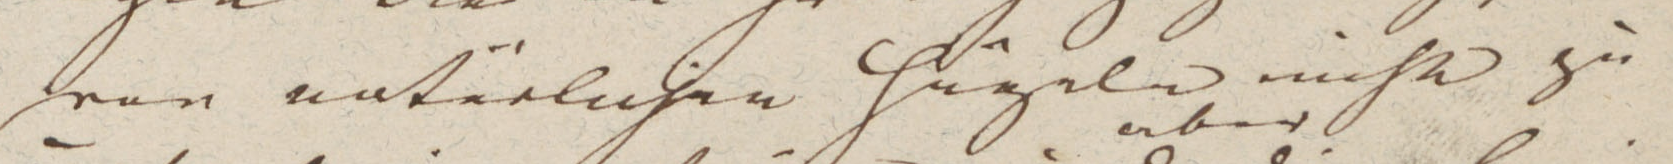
von natürlichen Hügeln nicht zu
